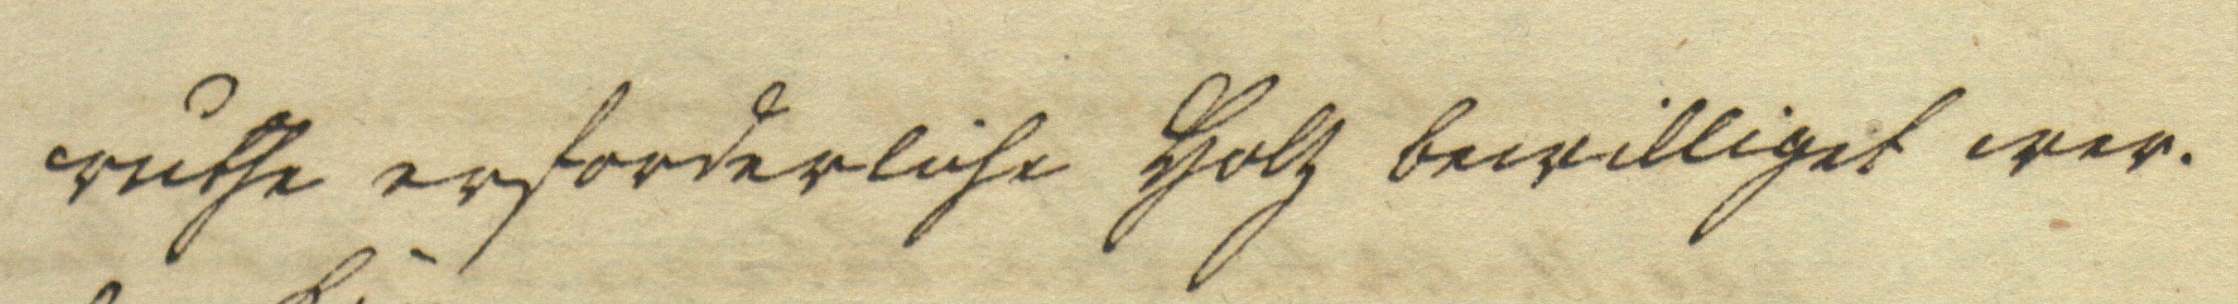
ruthe erforderliche Holz bewilliget wer¬
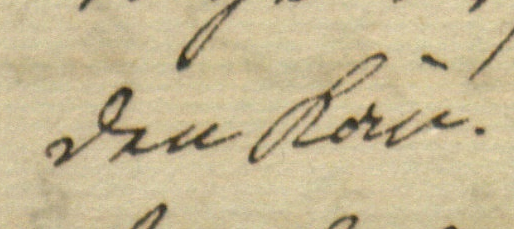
den kan.
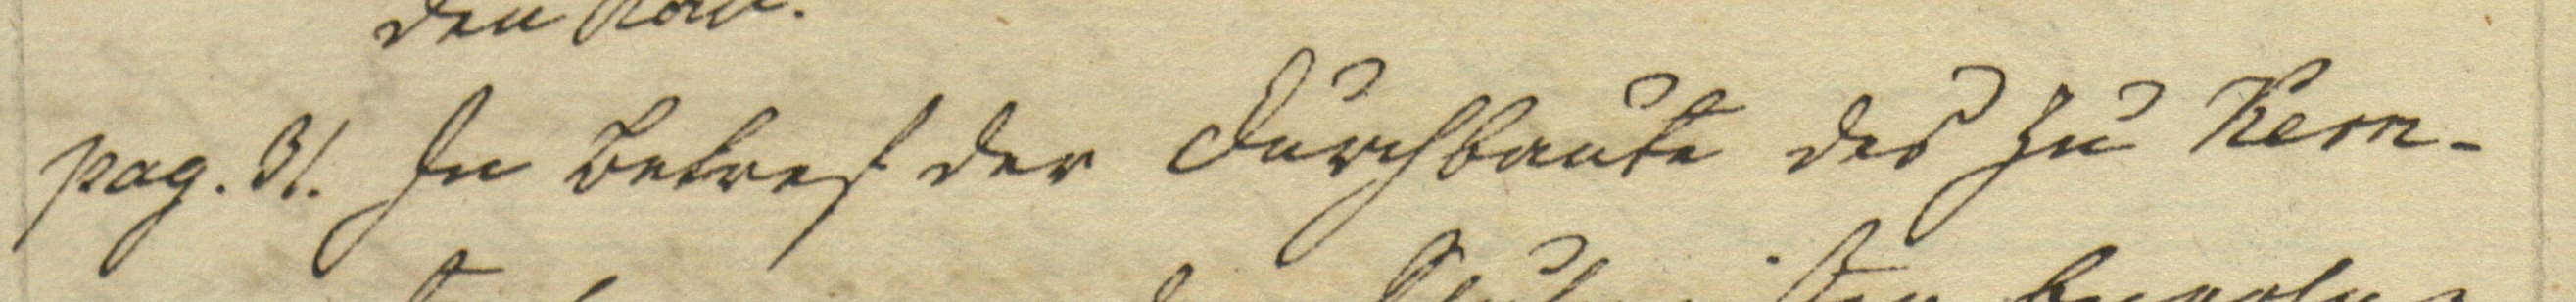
pag. 31. In Betref der Durchbaute des zu Kem¬
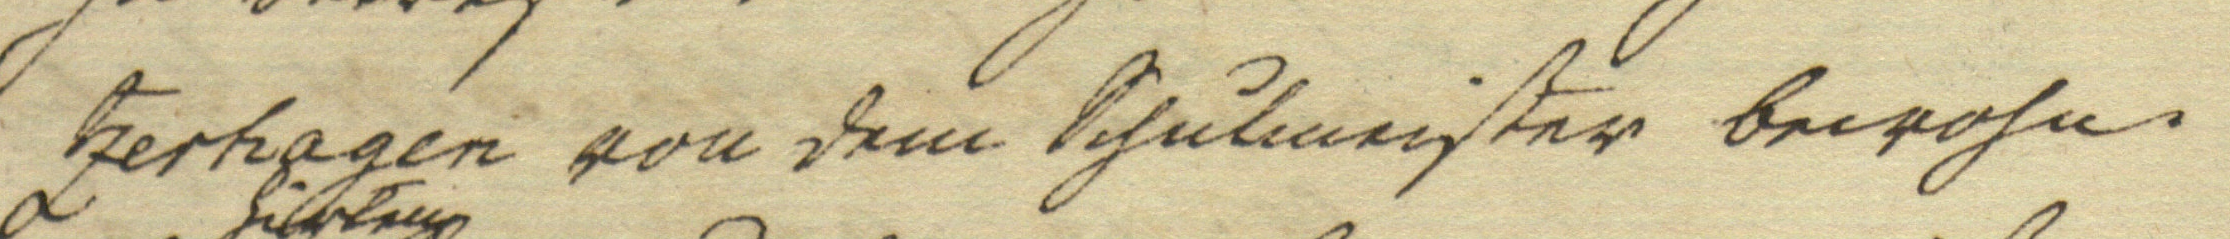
tzerhagen von dem Schulmeister bewohn¬
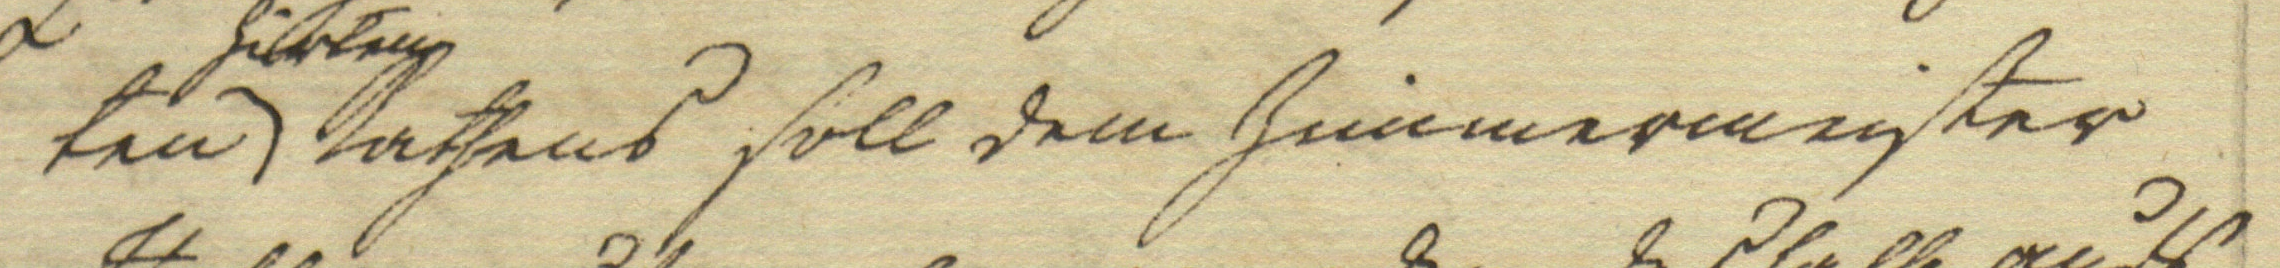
ten, Hirten Kathens soll dem Zimmermeister
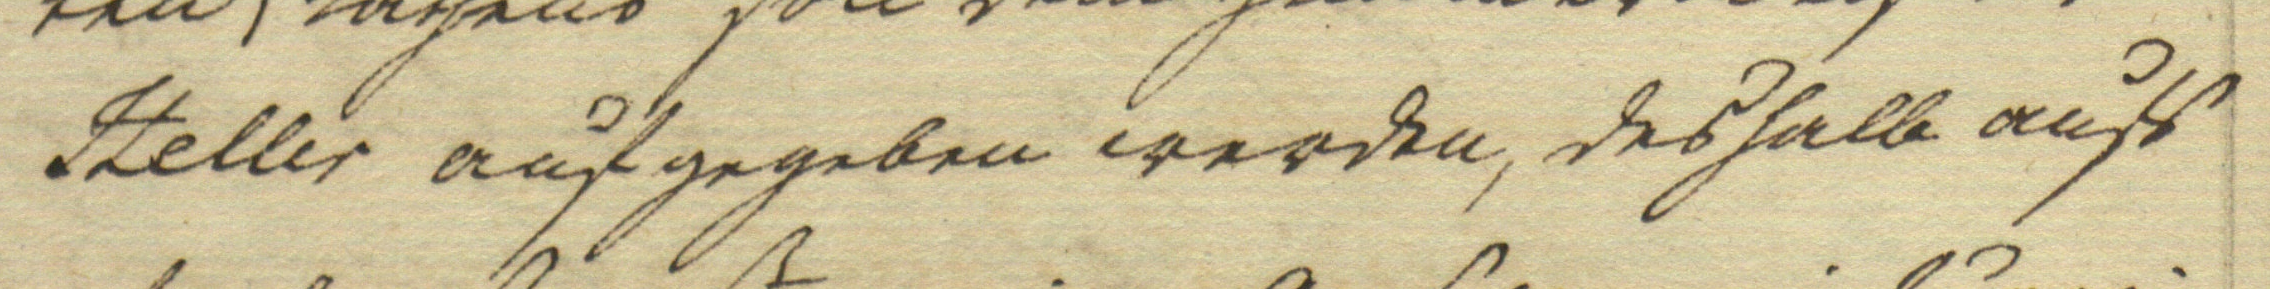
Heller aufgegeben werden, deshalb aufs
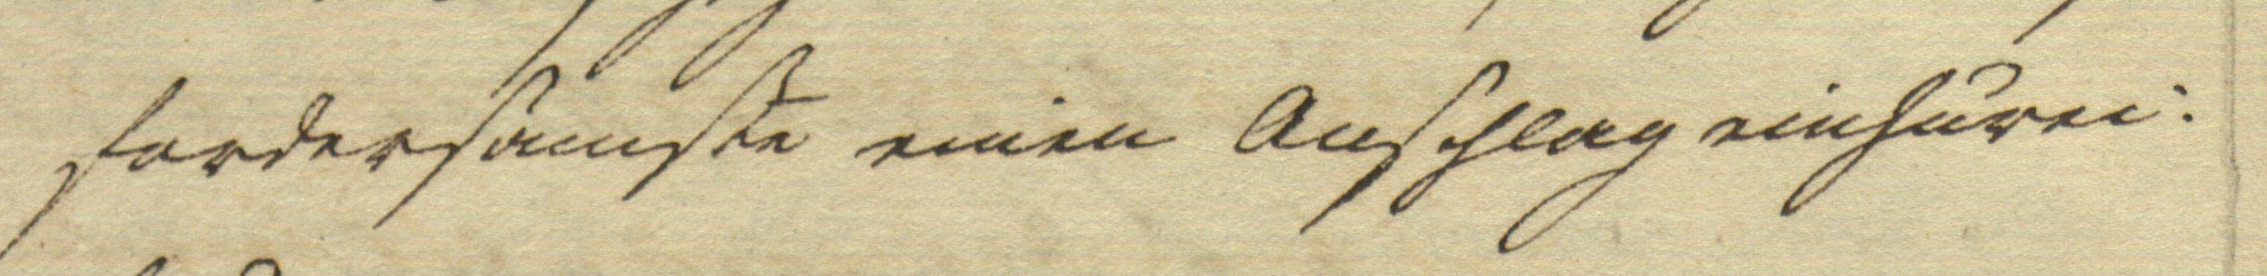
fordersamste einen Anschlag einzurei¬
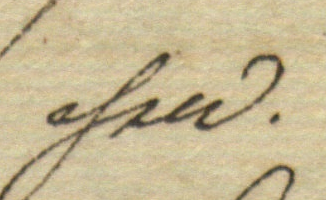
chen.
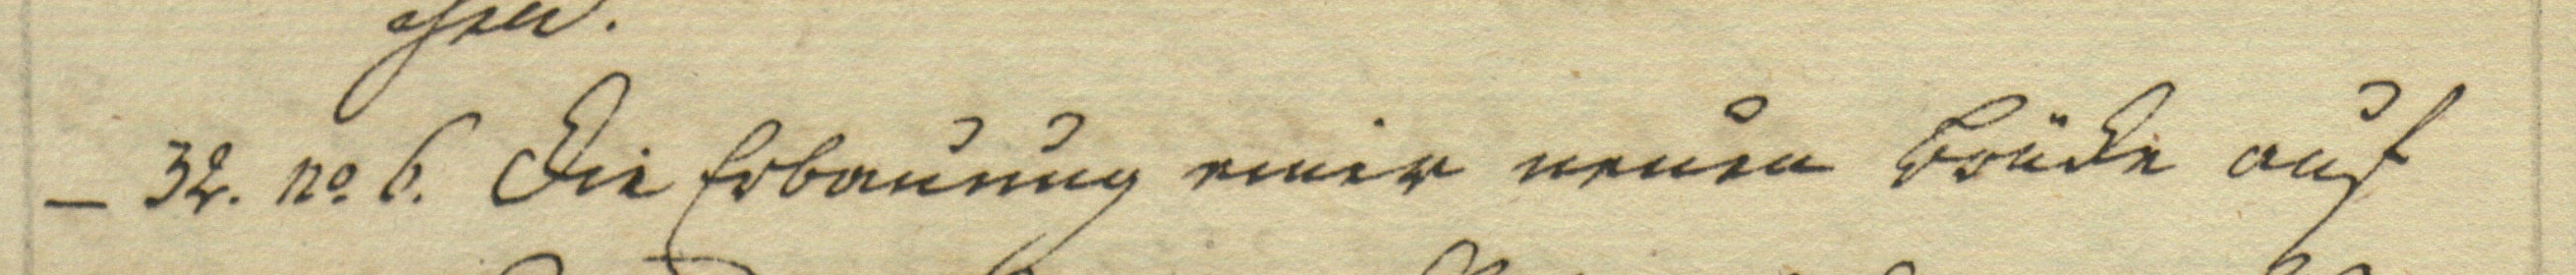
32. No 6. Die Erbauung einer neuen Brücke auf
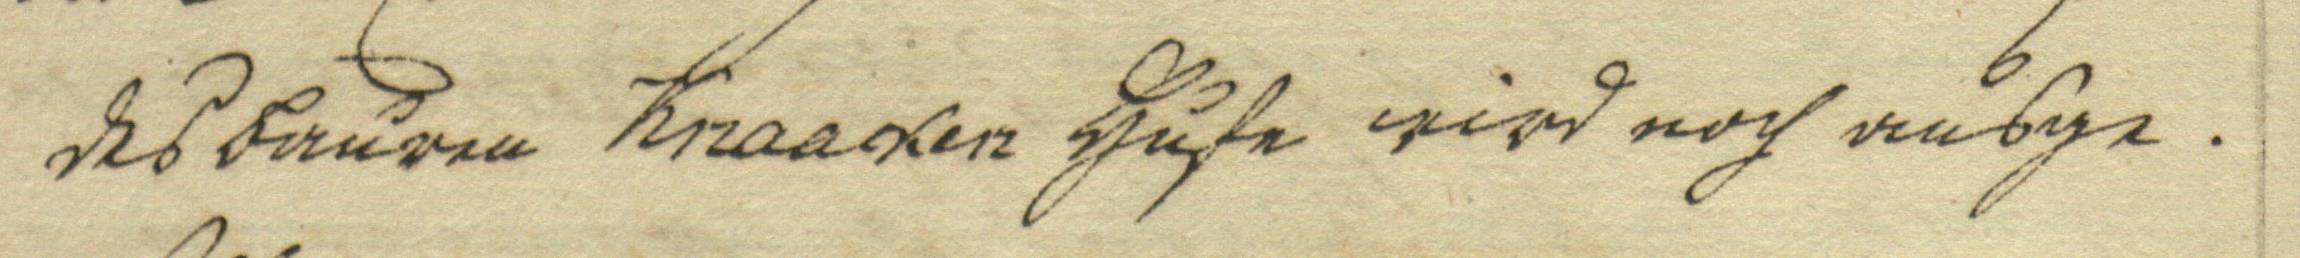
des Bauren Knaacken Hufe wird noch ausge¬
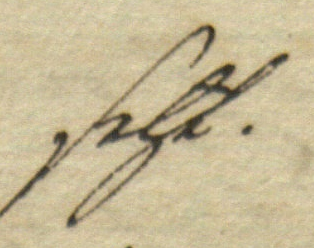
setzt.
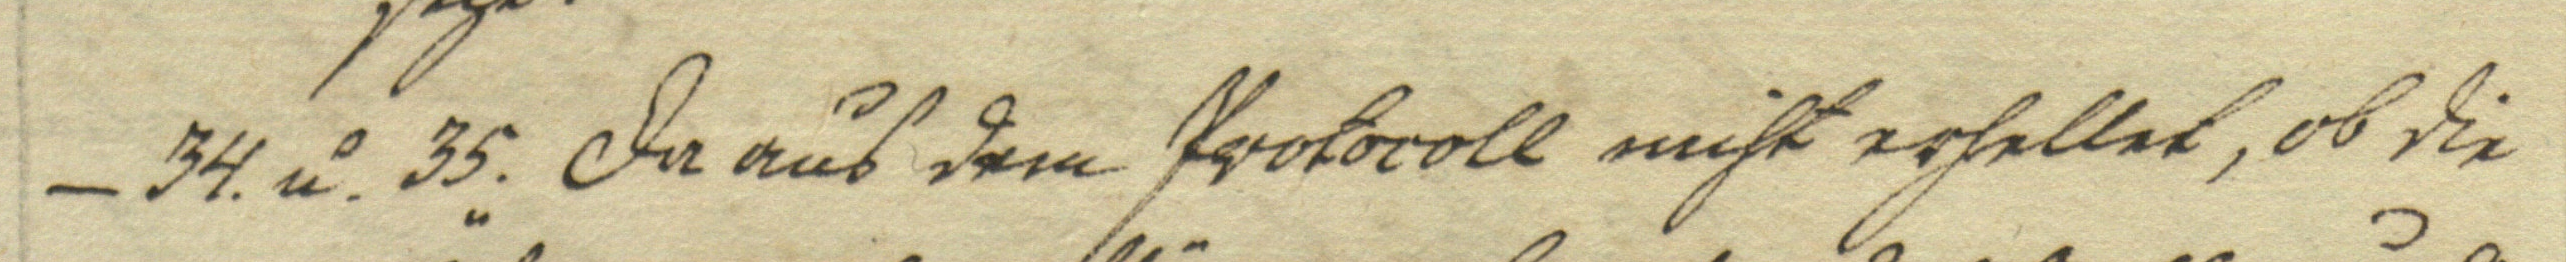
34. u. 35. Da aus dem Protocoll nicht erhellet, ob die
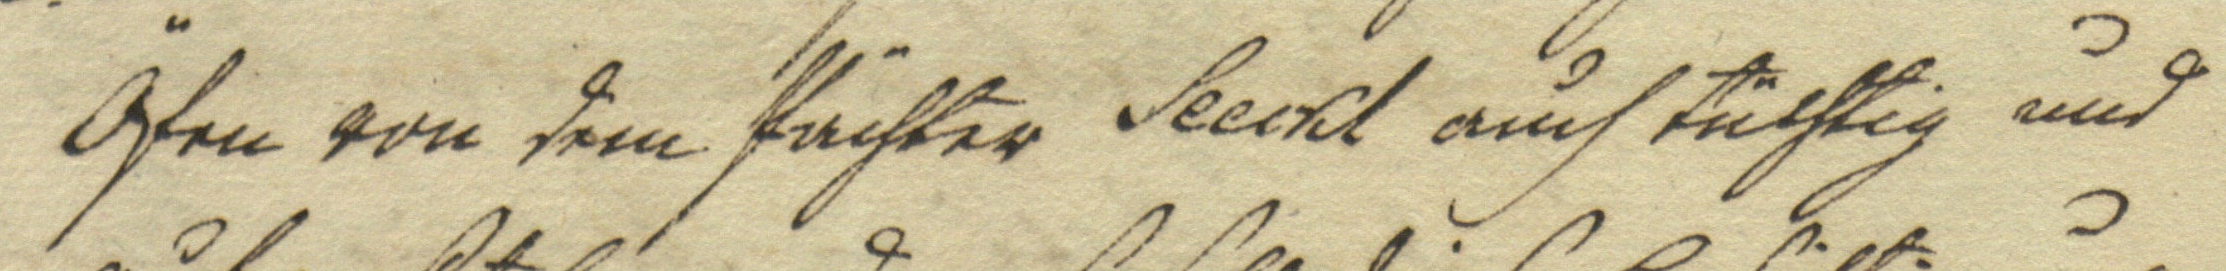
Öfen von dem Pächter Seeckt auch tüchtig und
